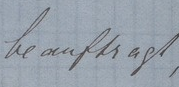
der unsrigen
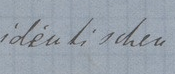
identischen
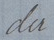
Note
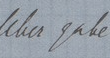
gleichzeitige
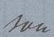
statt.
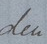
den
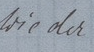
von Herrn
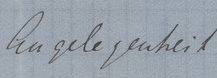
Angelegenheit
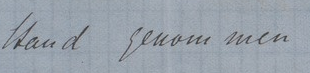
Hand genommen
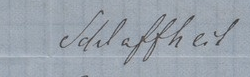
Schlaffheit
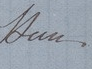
wird.
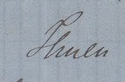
Ihnen
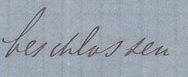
beschlossen
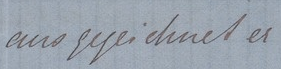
Mit ausgezeichneter
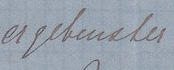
ergebenster
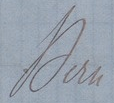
Bern
